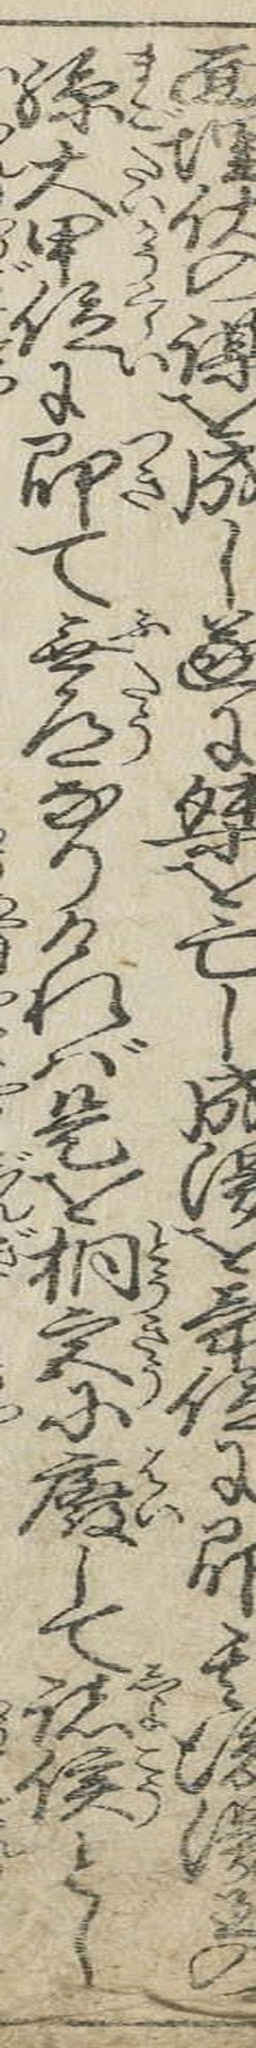孫大甲位即て無道なりければ是を桐宮に廃して諸侯とし
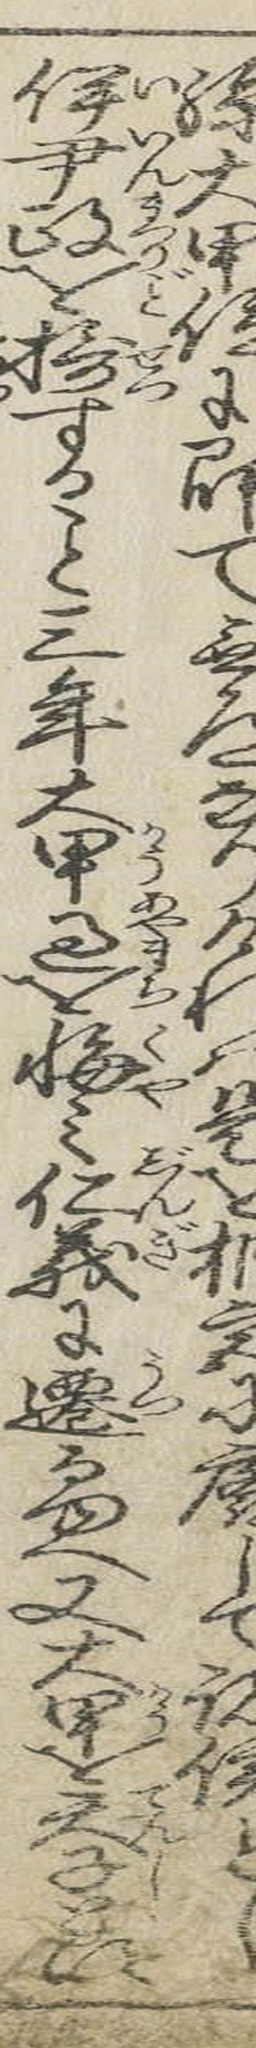伊尹政を摂すること三年大甲過を悔み仁義に遷るゆへ又大甲を天子とす
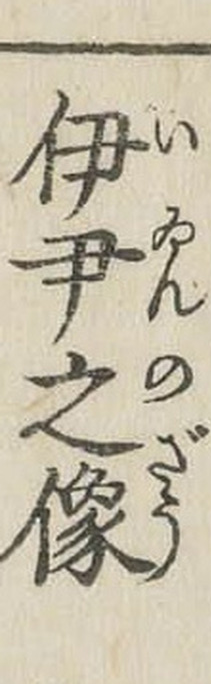伊尹之像
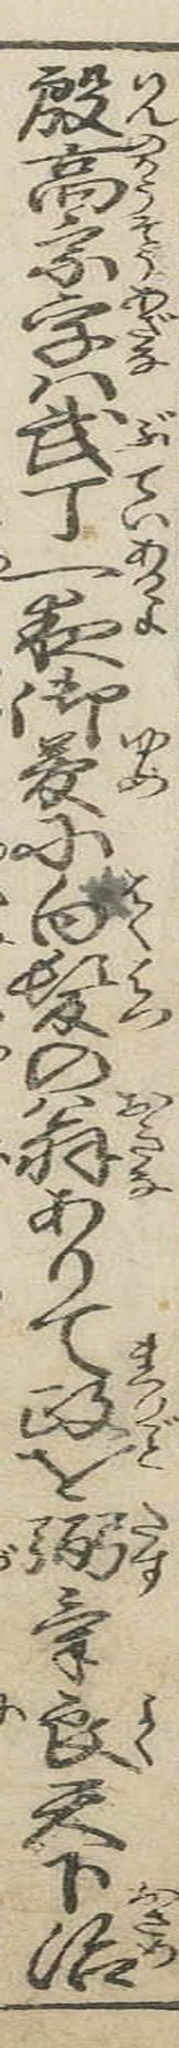殷の高宗字は武丁一夜御夢に白髪の翁ありて政を弼け良天下治
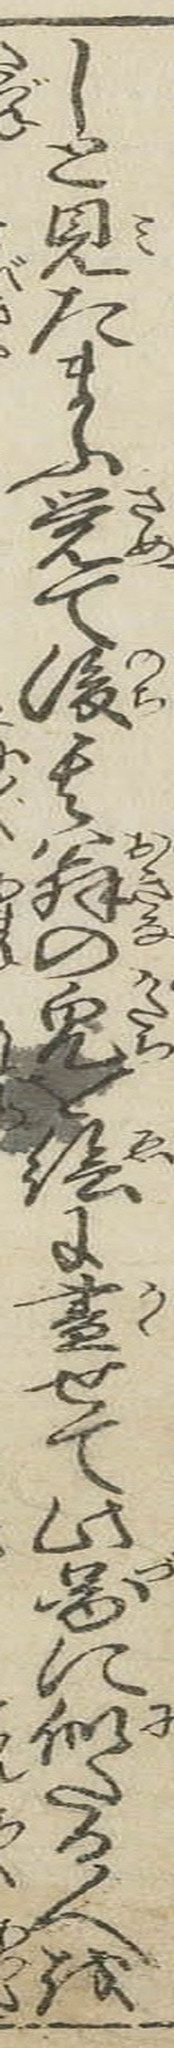しと見たまふ覚て後其翁の皃を絵に画せて此図に似たる人を
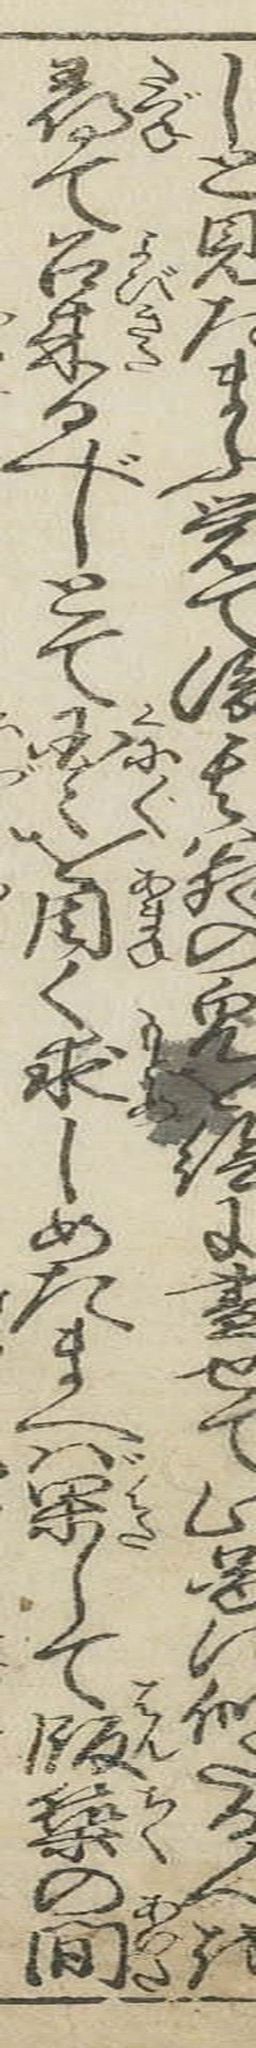尋て召来るべしとて国々を周く求しめたまへば果して版築の間
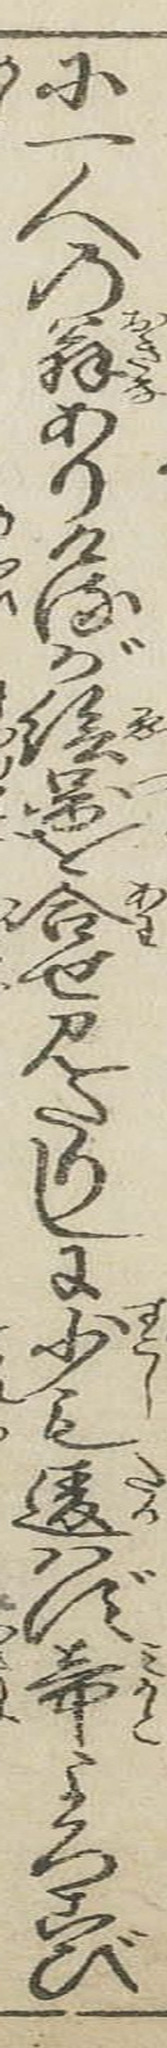に一人の翁ありけるが絵図を合せ見たりしに少も違はず帝よろこび
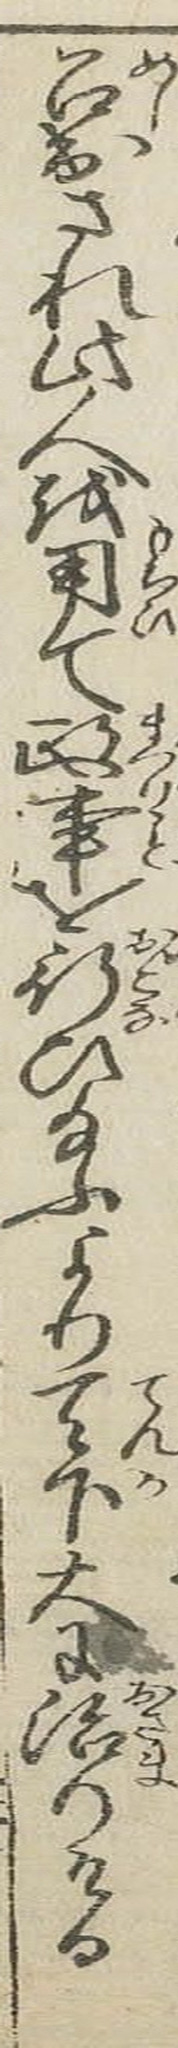召出され此人を用て政事を行ひ給ふより天下大に治りける

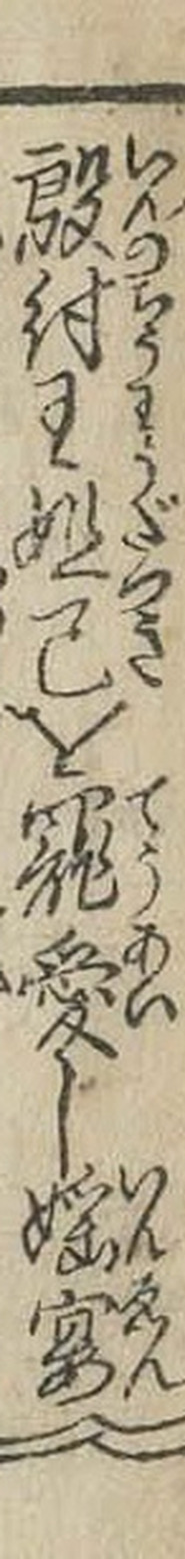殷紂王妲己を寵愛し婬宴
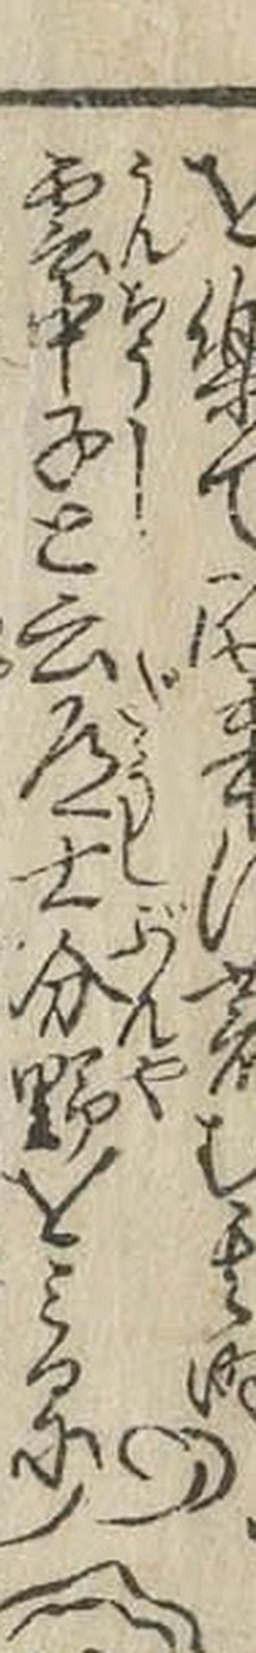雲中子と云道士分野をみるに
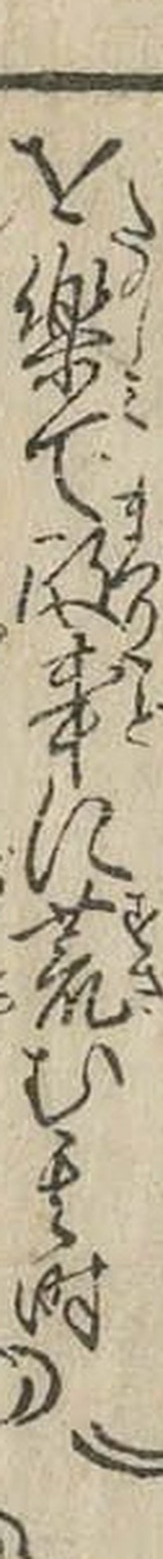を楽て政事に荒む其時
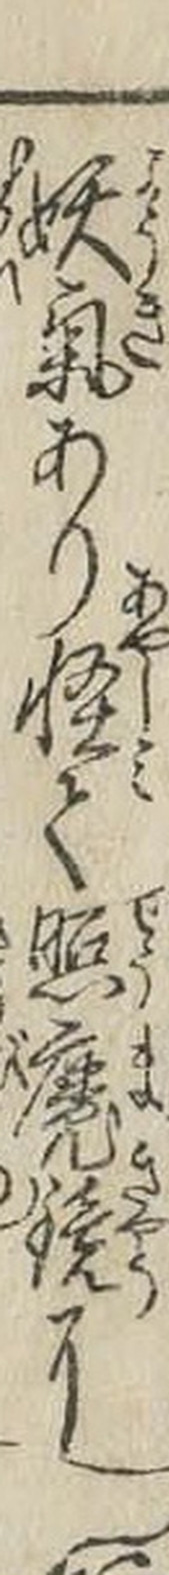妖気あり怪て照魔鏡に
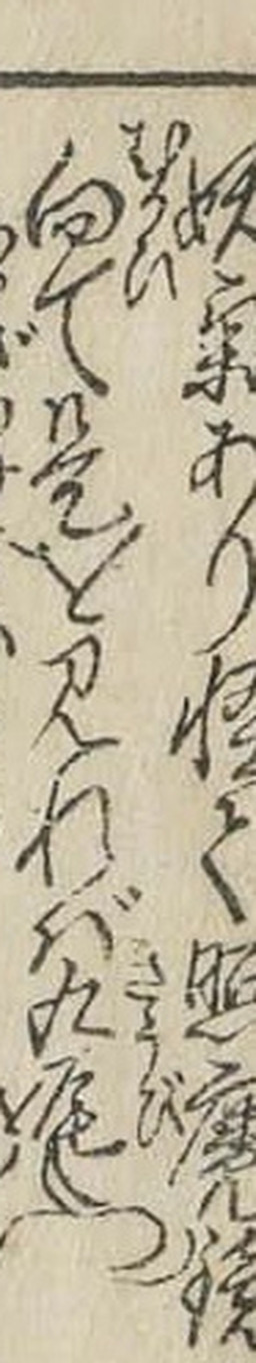向て是を見れば九尾
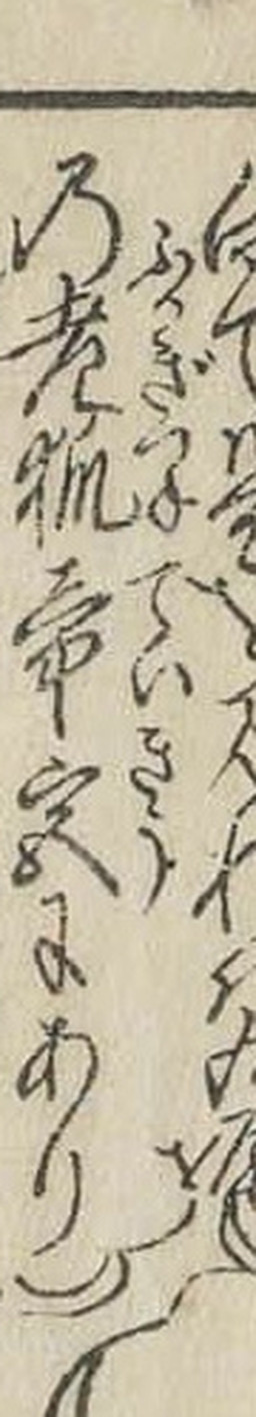の老狐帝宮にあり
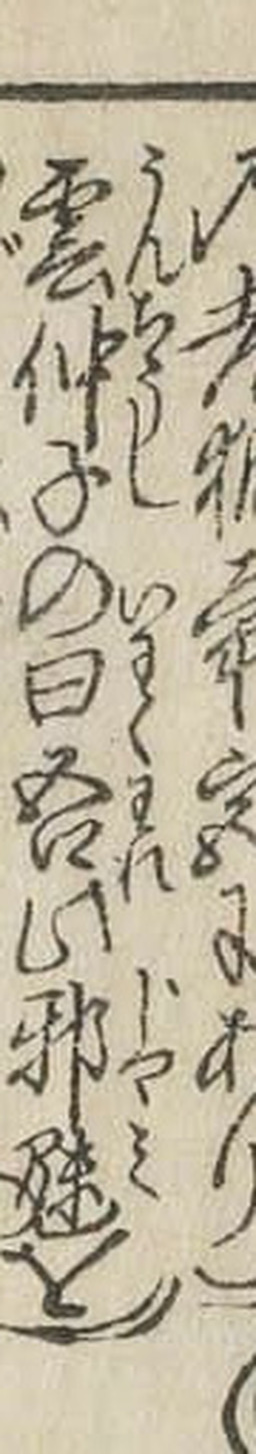雲仲子の曰吾此邪魅を
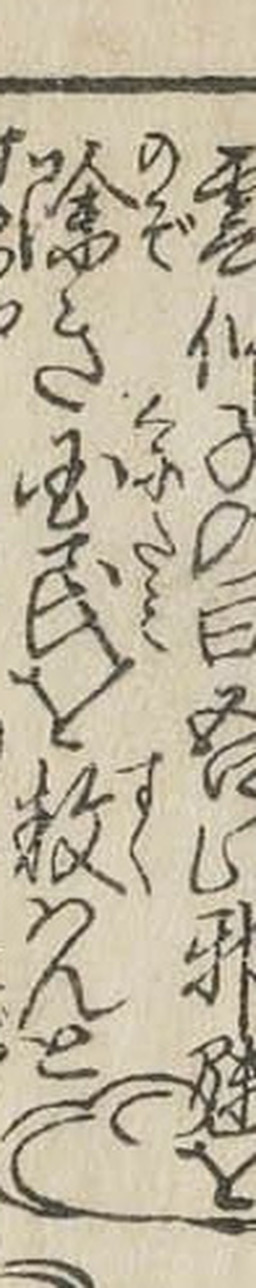除き国民を救はんと
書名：絵本写宝袋 9巻 4之巻
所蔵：東京学芸大学教育コンテンツアーカイブ
